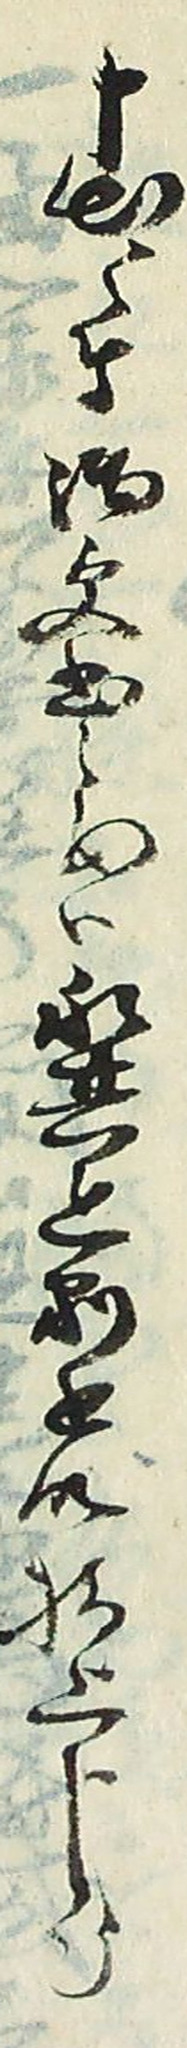申出候に付御受書之義は私共連判を以指上申候
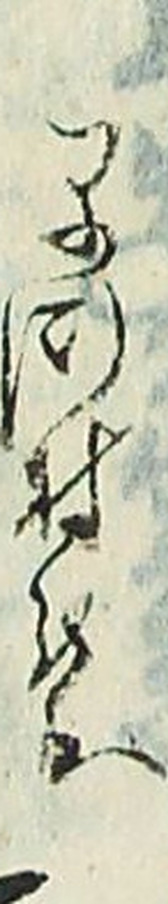早淵村庄屋
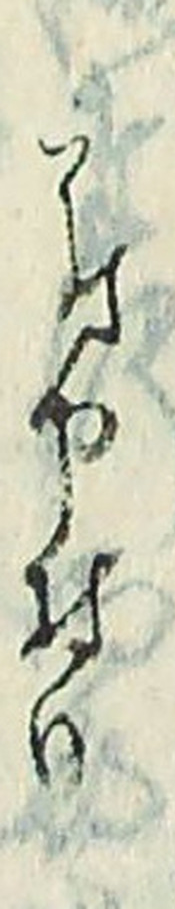府中村同
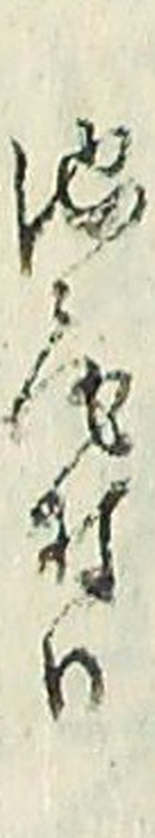池尻村同
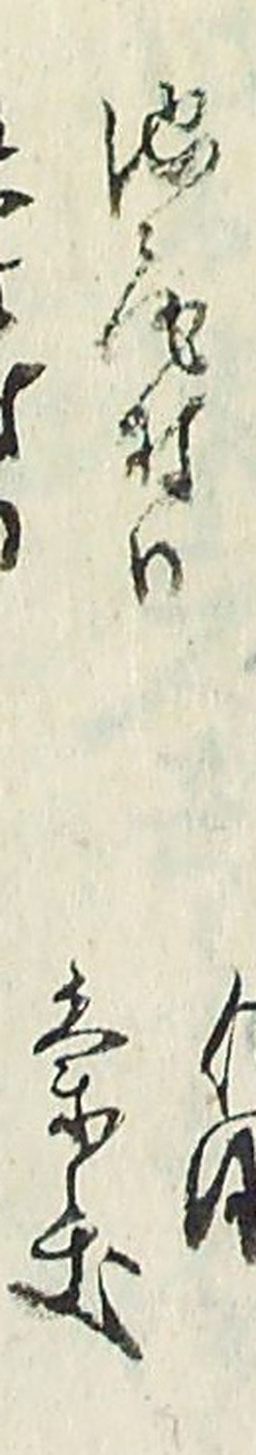久米之丈
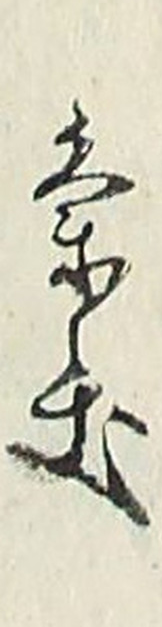久米之丈
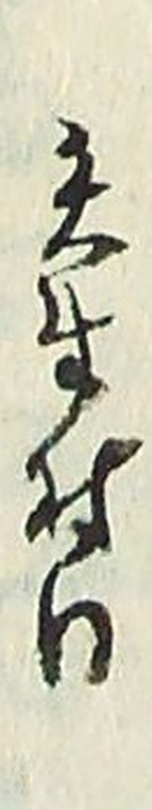矢野村同
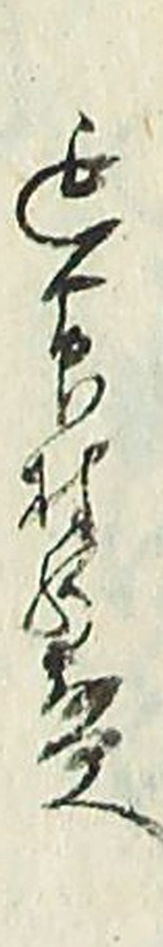早淵村庄屋
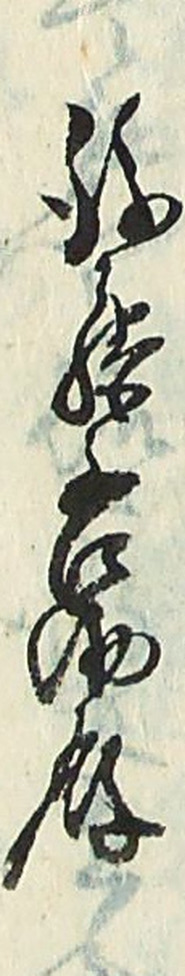後藤善助殿
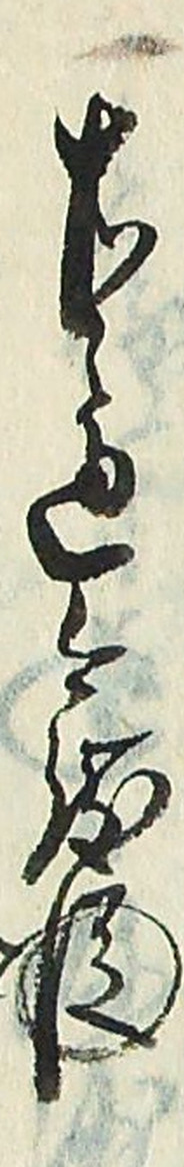右之通今度従
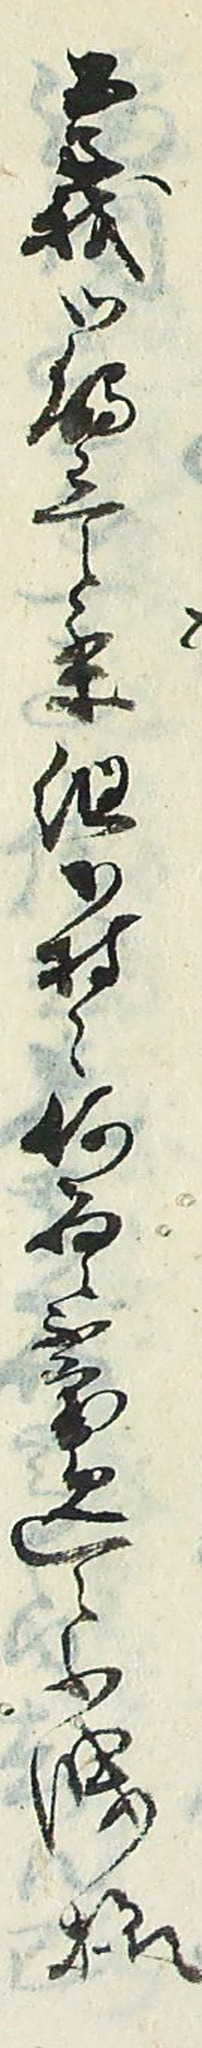公義御触有之候条組下村々何者に不寄逸々不洩様
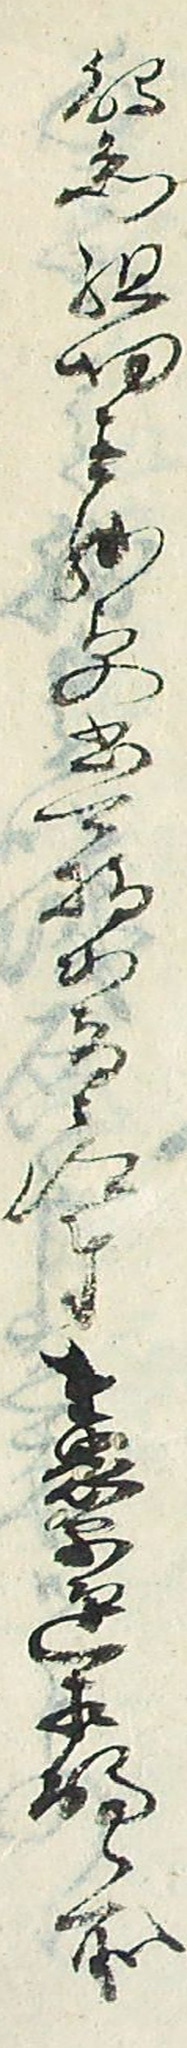触知組切壱紙受書可指出旨被仰付奉畏早速相触候所

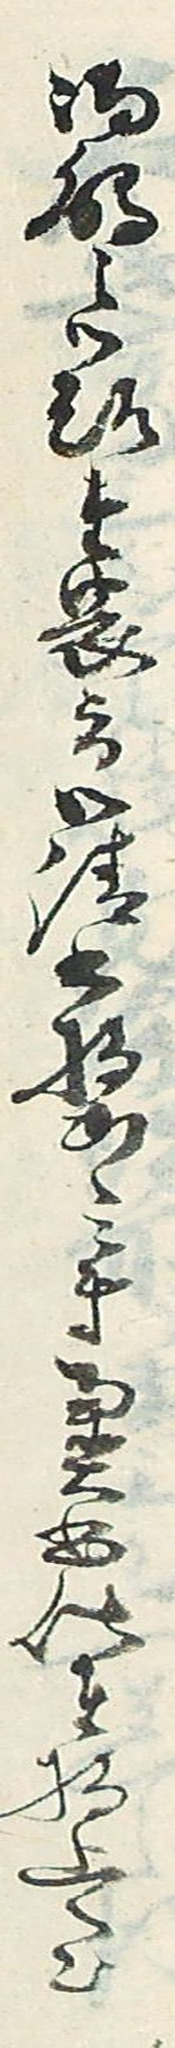御触書之御趣奉畏旨御請書指出候に付奥書仕指出候以上
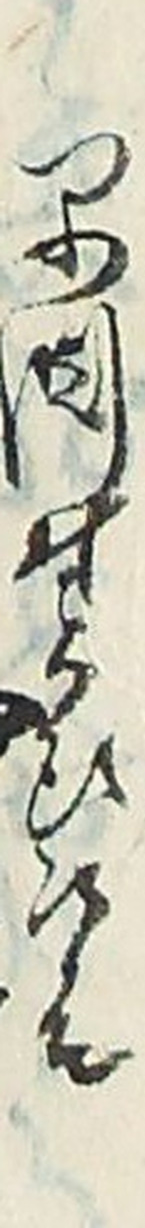早淵村与頭庄屋
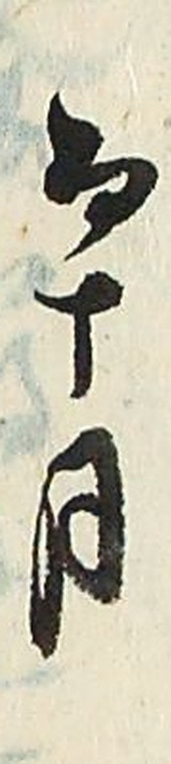酉十月
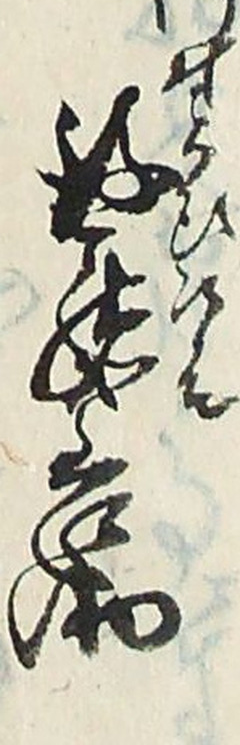後藤善助
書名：諸御用御□受書控
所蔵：鳴門教育大学 Naruto University of Education
